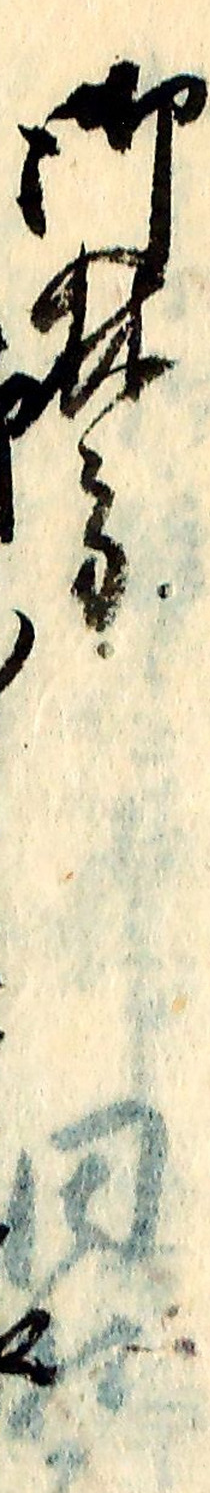御林方
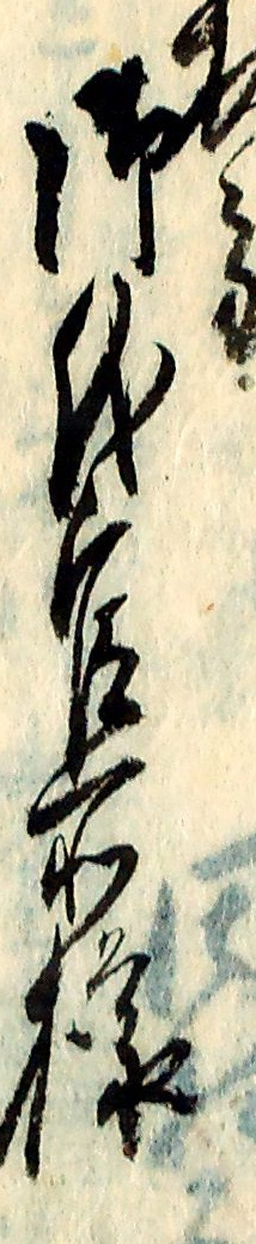御代官所様
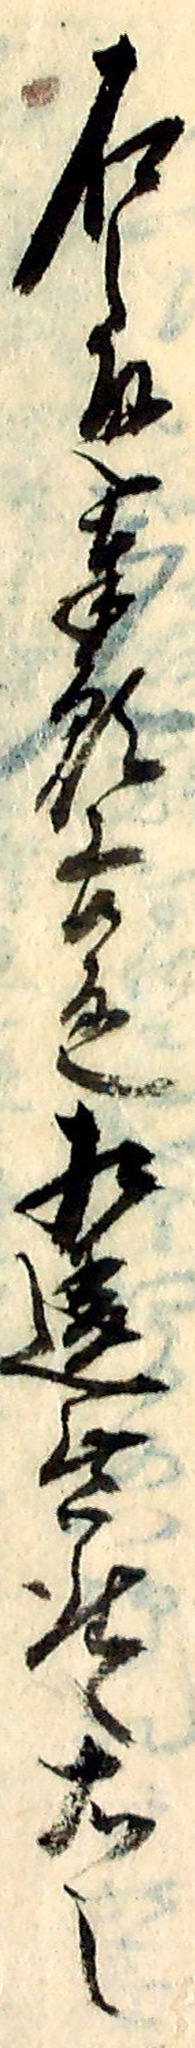右之通奉願上候通相違無御座候右之
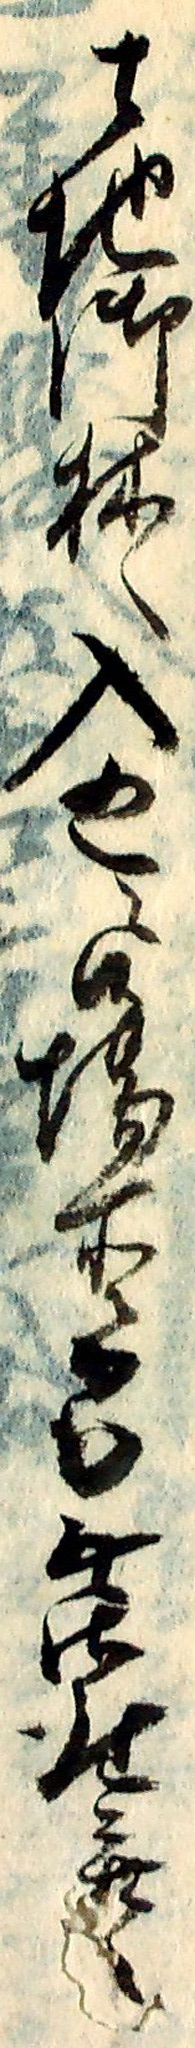土地御林へ入込み候場所にても無御座并に
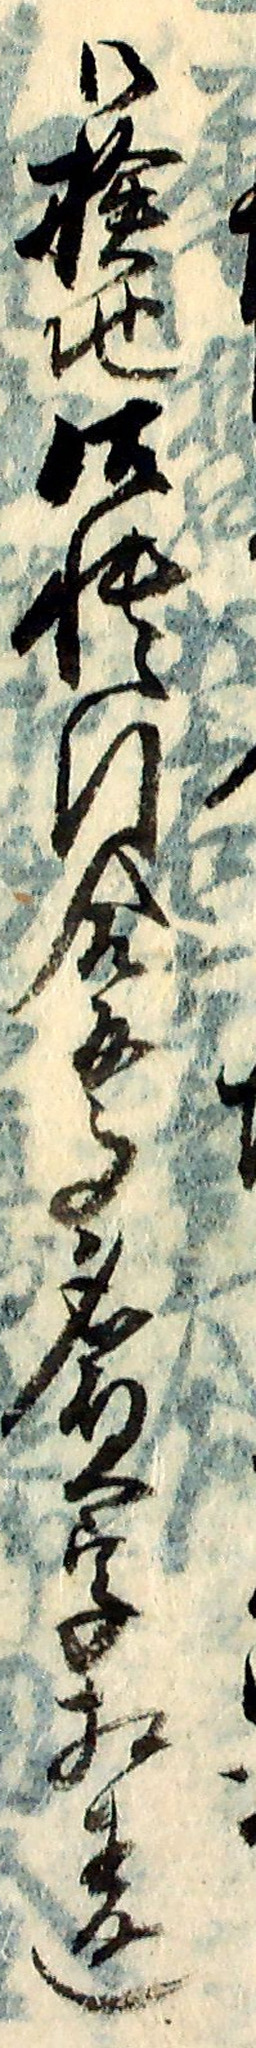御検地御帳引合反高名負字相違
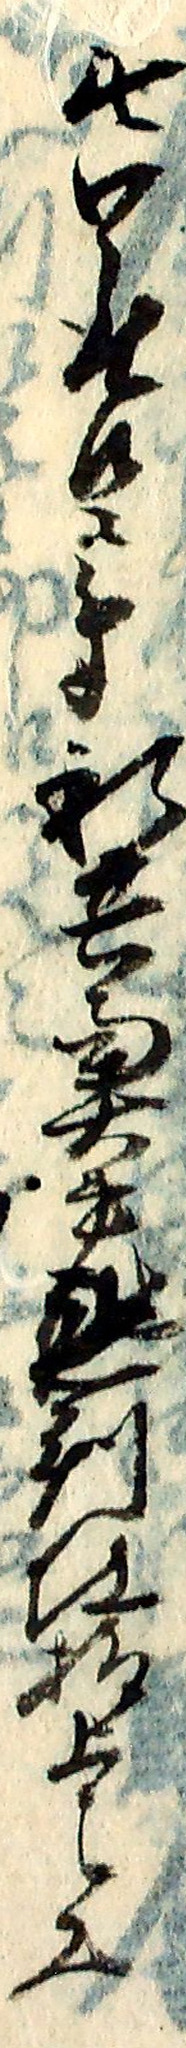無御座候に付私共奥書連判仕指上申候以上
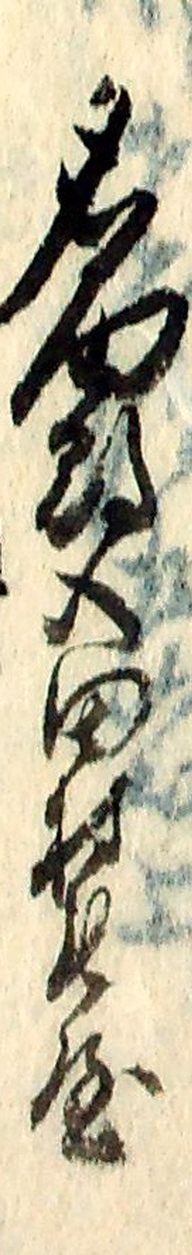名西郡入田村庄屋
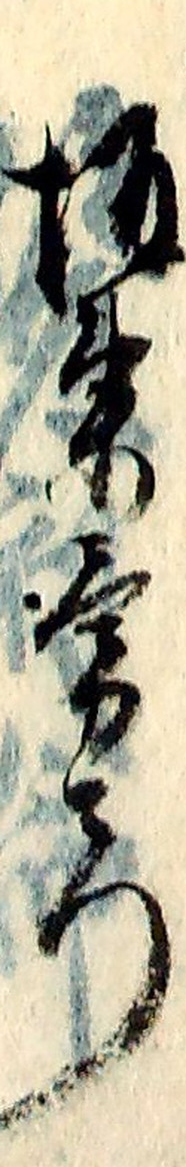坂東勇右衛門
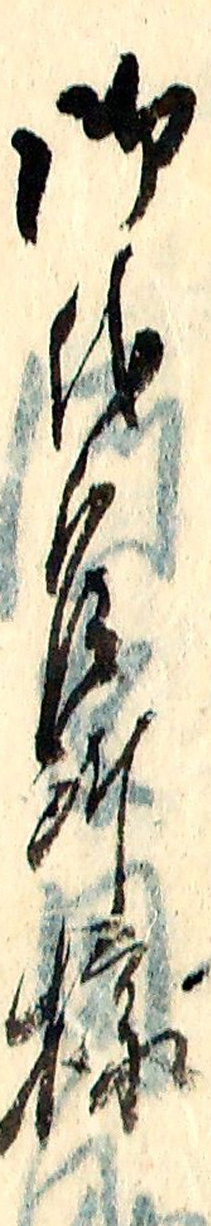御代官所様
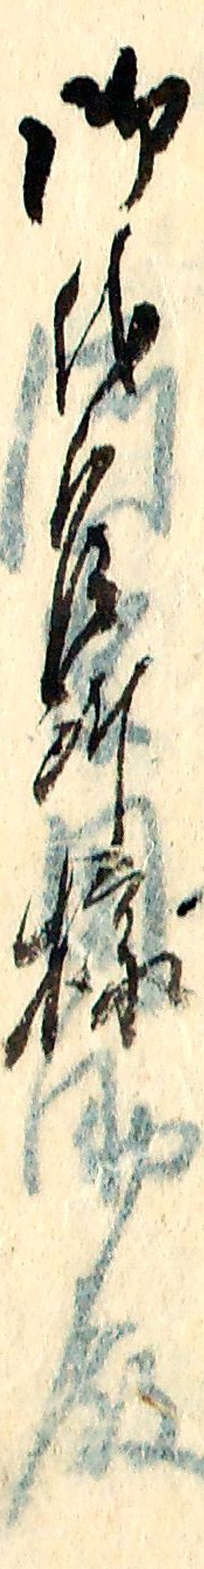御代官所様

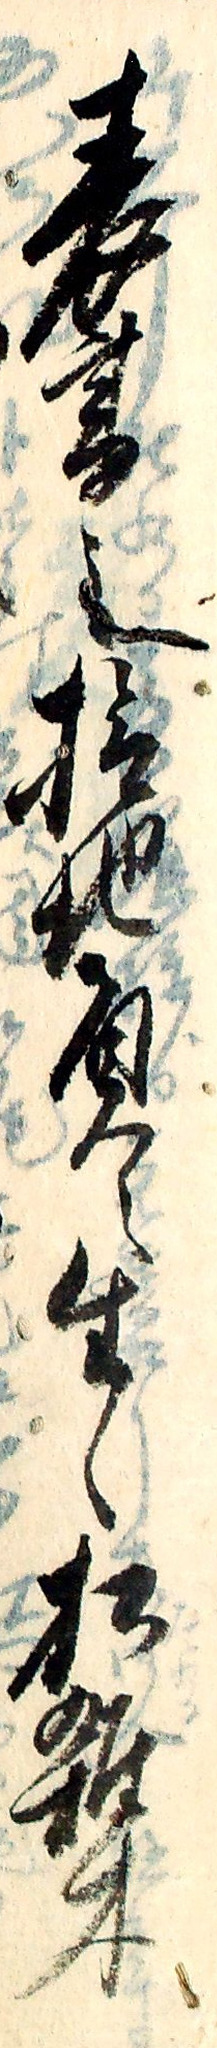表書之検地負に生候松雑木
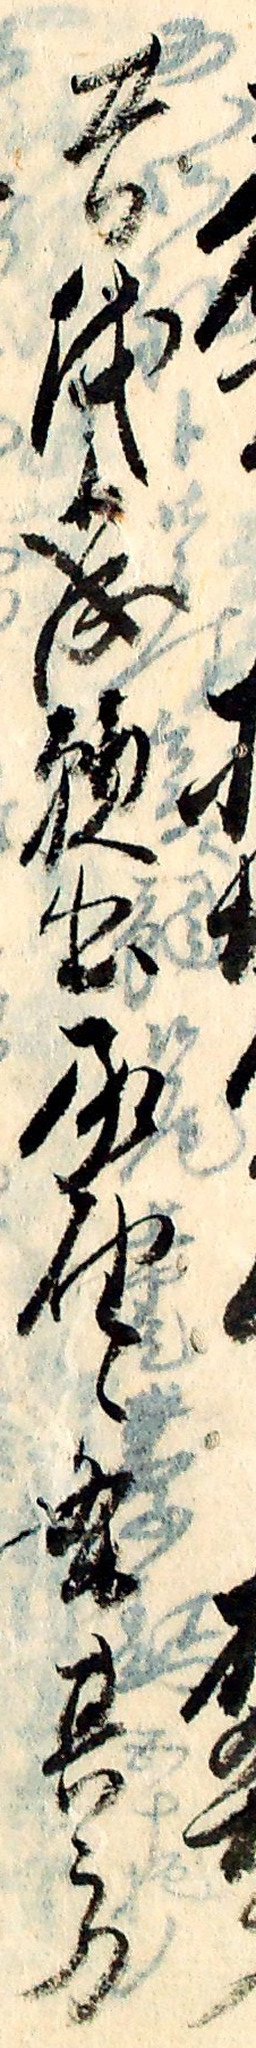共伐取成願書承届候条其方
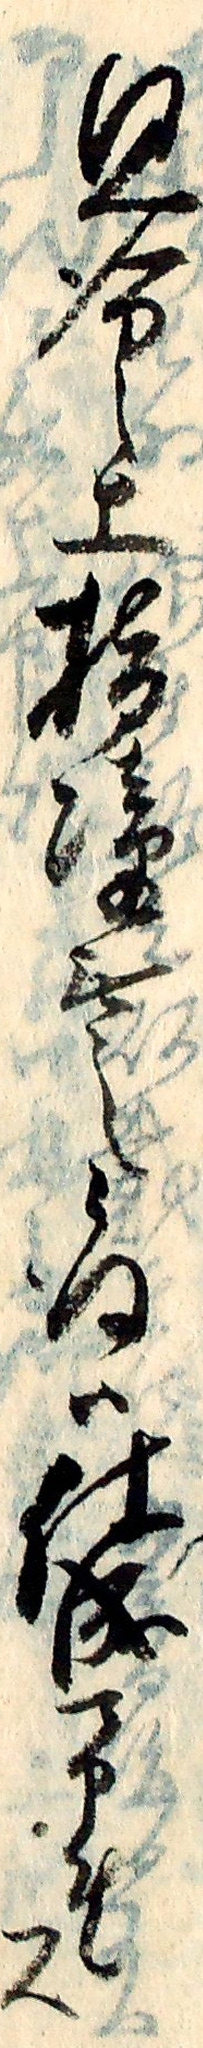見分之上指障無之候得は仕成可申付候以上
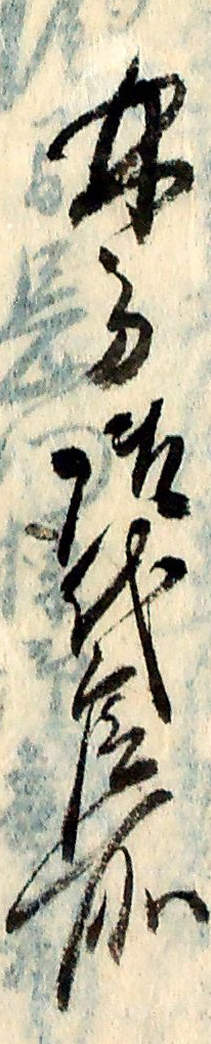林方御代官所
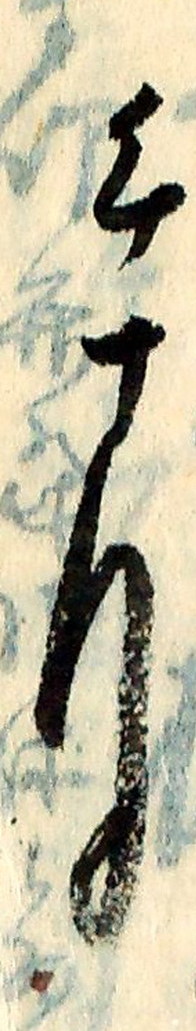午十月
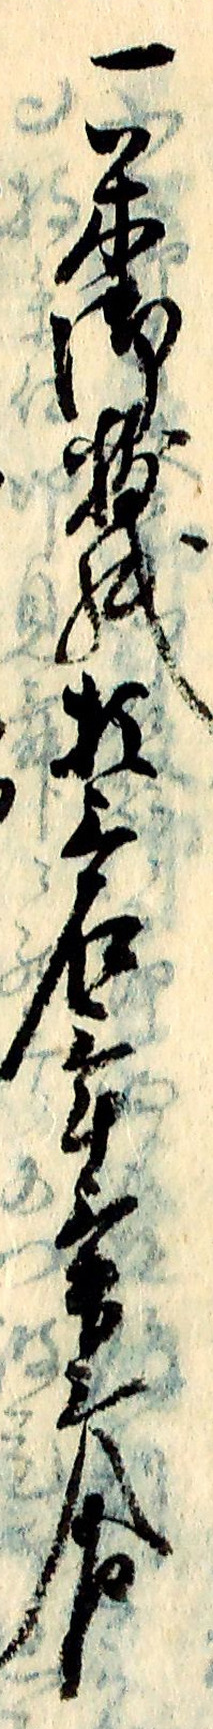一米御指紙拾三石三斗三升三合
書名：諸御願書控(後藤氏壱番）
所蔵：鳴門教育大学 Naruto University of Education
